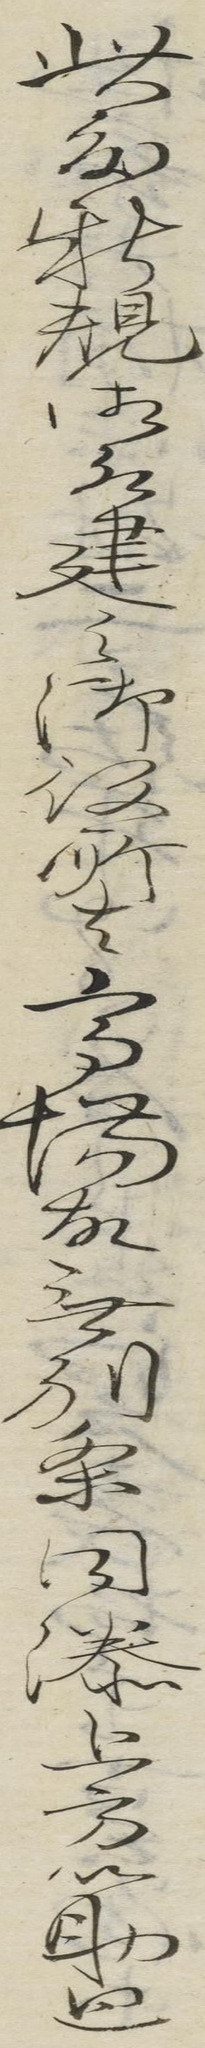此度新規御取建之御役所は高場故無別条同湊上方筋廻
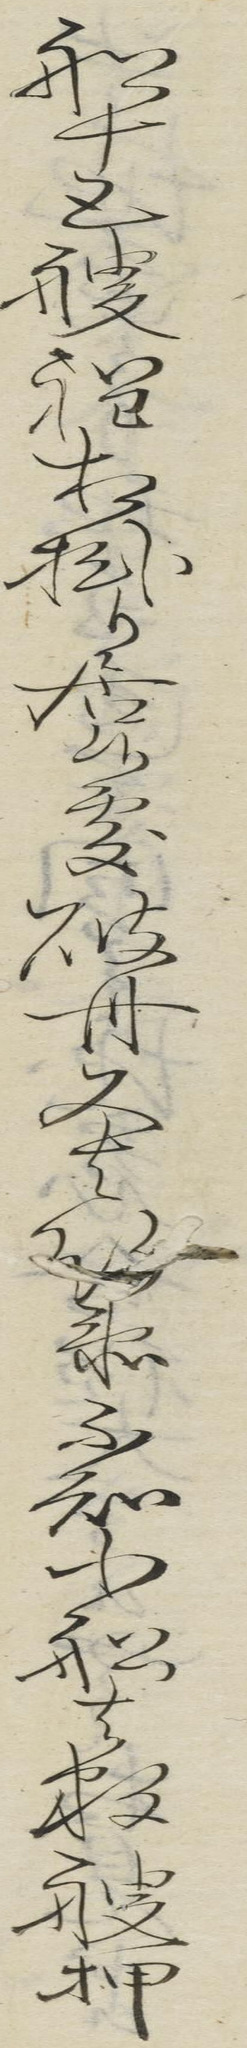船十五艘程相掛り居候処破舟又は行衛不知小船は数艘押
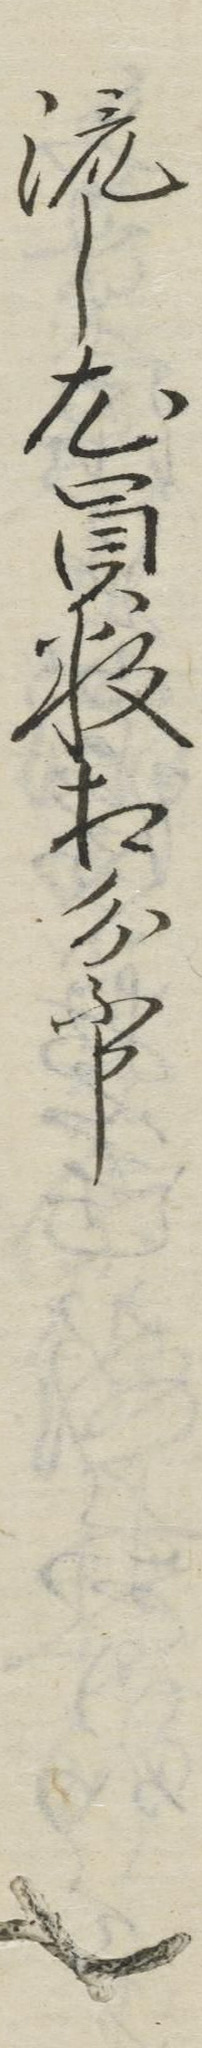流し尤員数相分不申
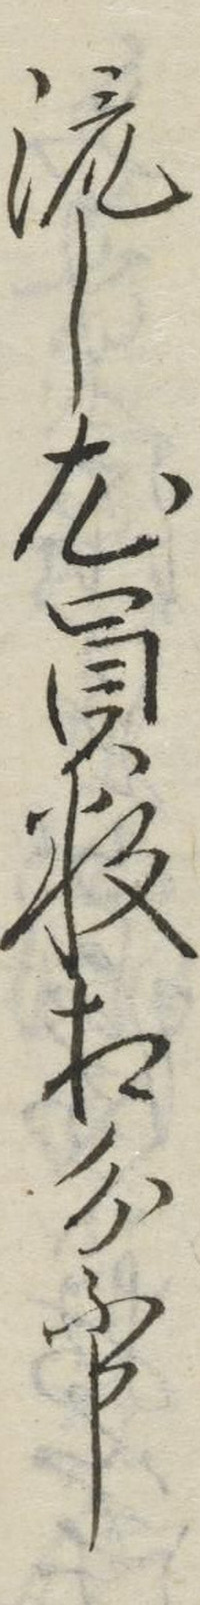流し尤員数相分不申
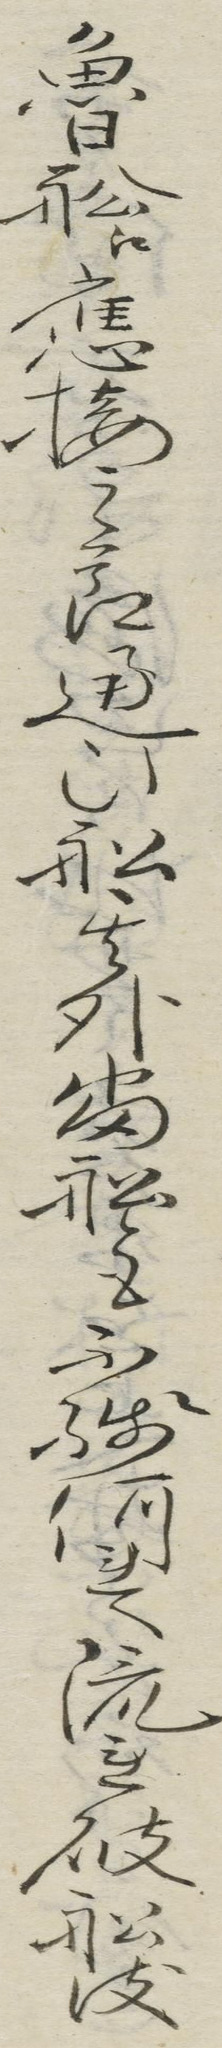魯船江応接之節通ひ船其外番船とも不残何れへ流れ破船致
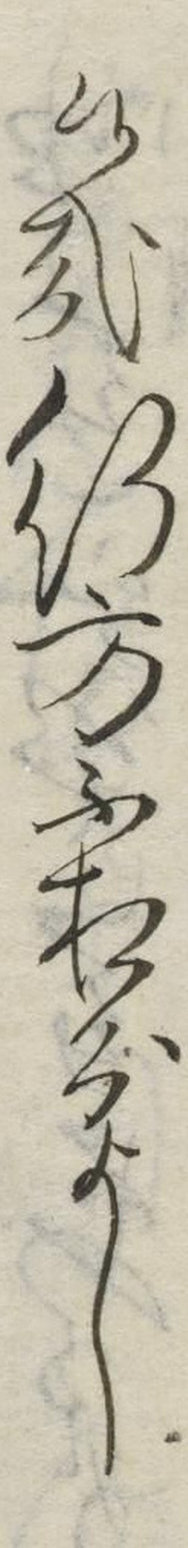候哉行方不相分よし
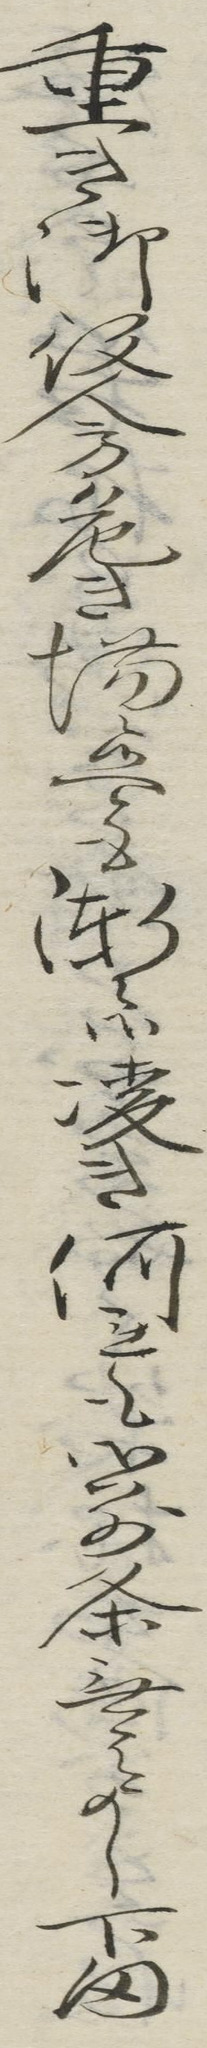重き御役人方危き場ニ候へとも漸〻御凌き何れも御別条無之よし下田
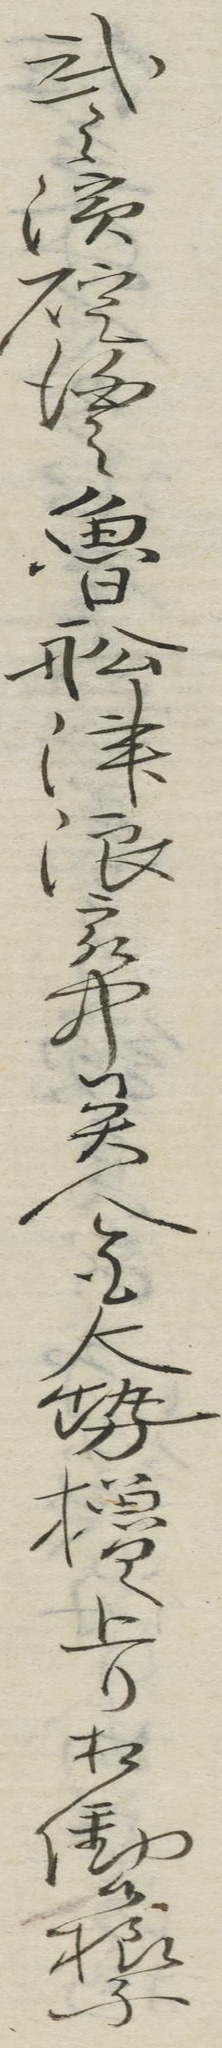此之浜碇泊之魯船津浪最中異人とも大勢櫓へ上り相働候様子
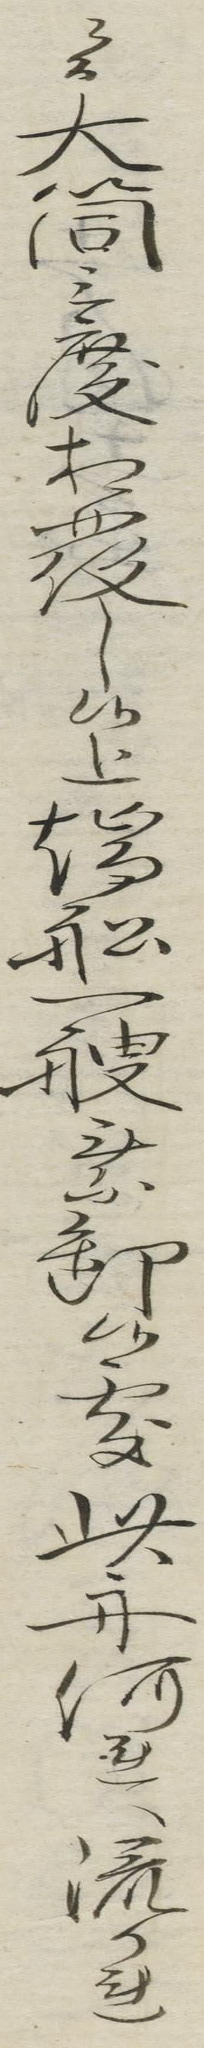ニ而大筒三度相覆し候上端船一艘乗卸候処此舟何れへ流かれ
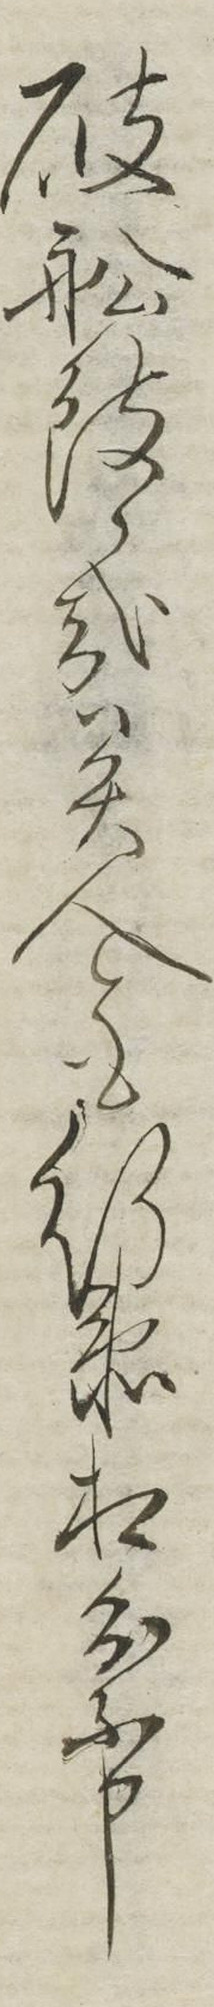破船致候哉異人とも行衛相分不申
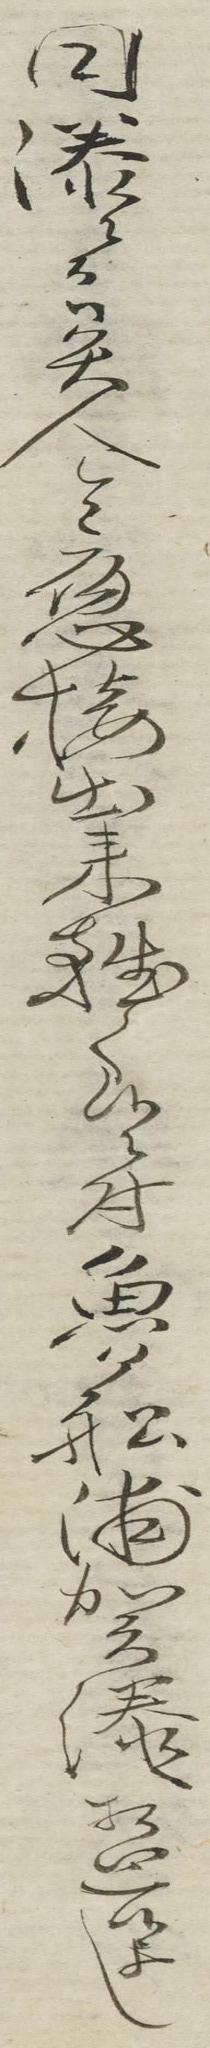同湊ニ而異人今応接出来難く候ニ付魯船浦賀湊へ相廻候よし
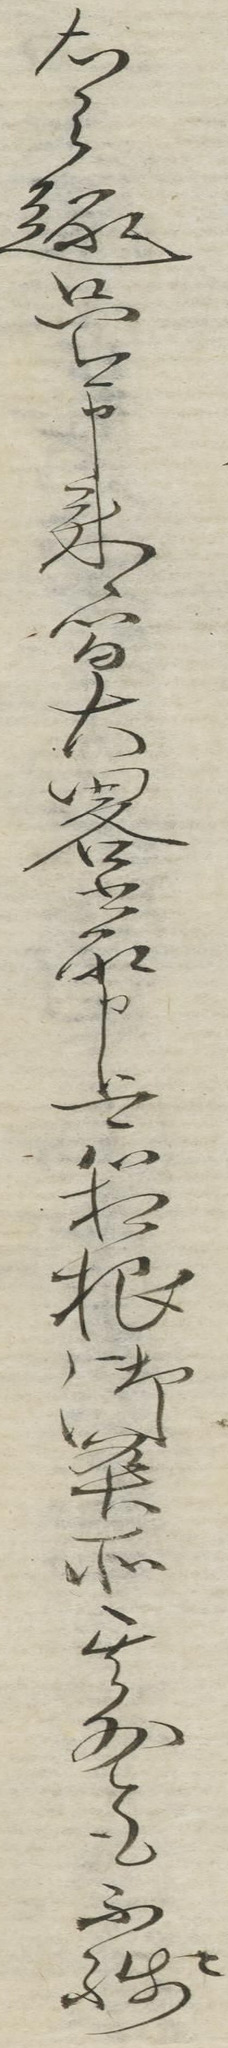右之趣只今申来候間大略書取申上候箱根御関所其外とも不残

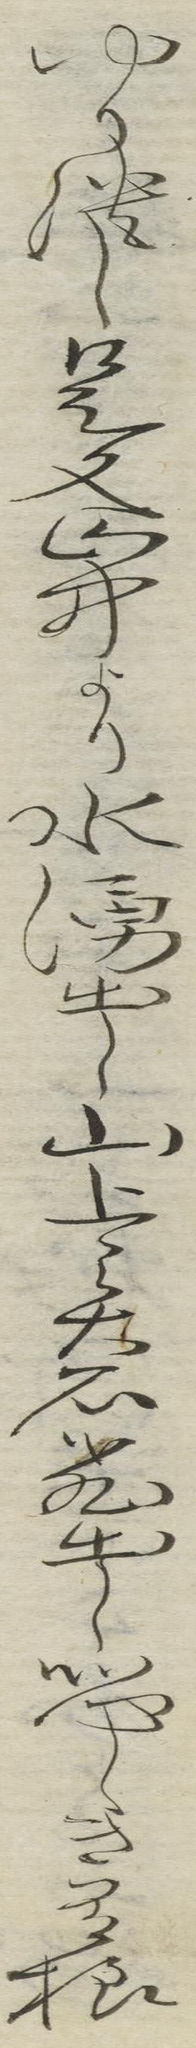ゆり潰し是又山中より水湧出し山上之大石飛出し恐しき有様
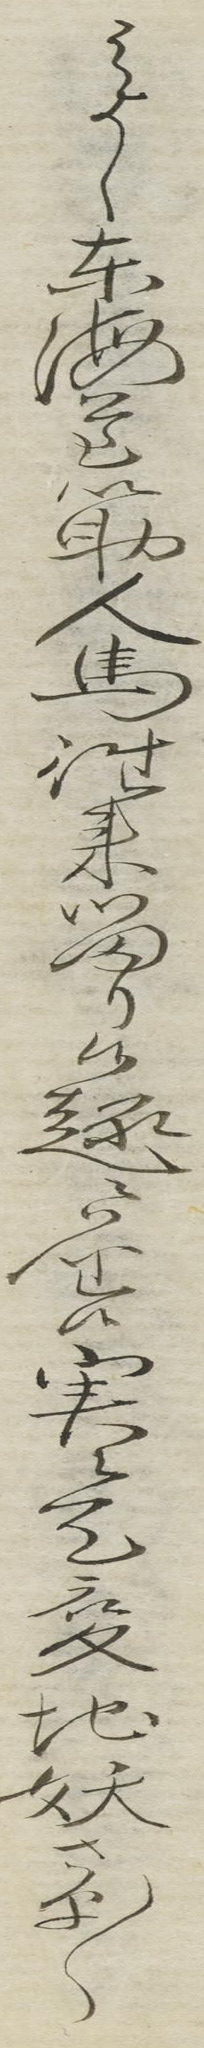之よし東海道筋人馬往来留り候趣ニ御座候実ニ天変地妖さま〳〵
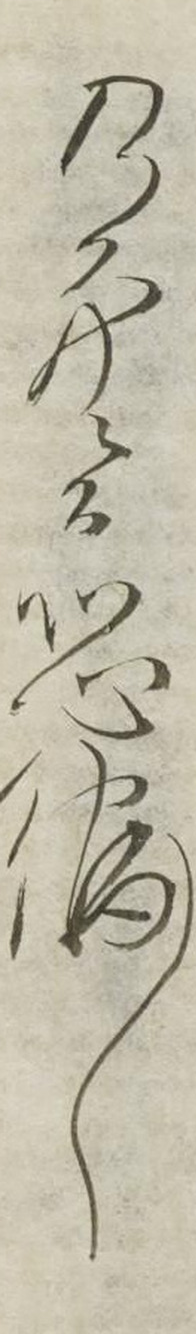の事ニ而恐縮〳〵
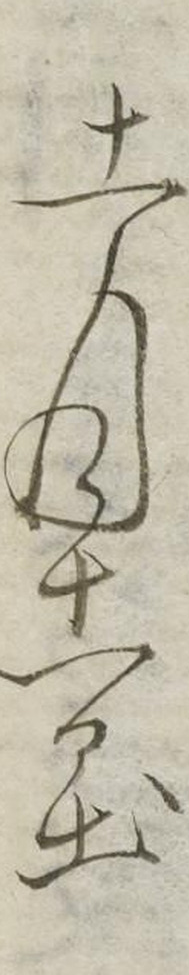十一月十一日出
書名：大地震實録
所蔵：東京大学地震研究所図書室 Earthquake Research Institute Library, The University of Tokyo, JAPAN
